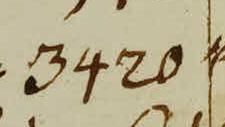3420
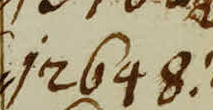12648
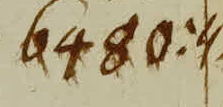6480:
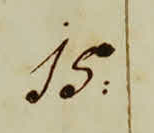15:
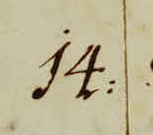14:
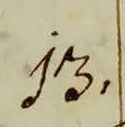13
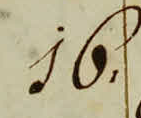16
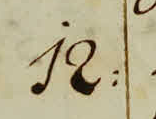12:
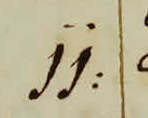11:
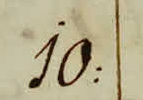10:
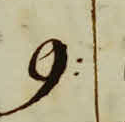9:
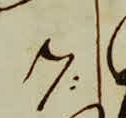7:
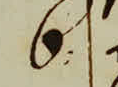6:
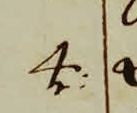4:
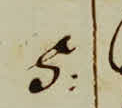5:
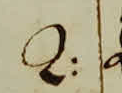2:
